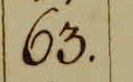63.
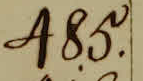485.
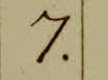7.
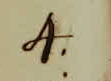4.
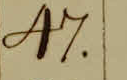47.
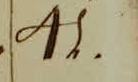41.
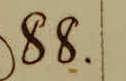88.
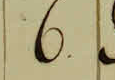6.
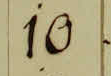10
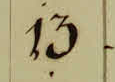13
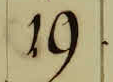19
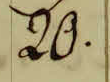20
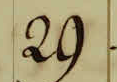29
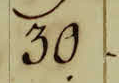30
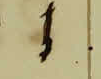1
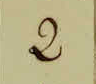2
